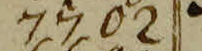7702
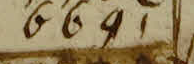6691
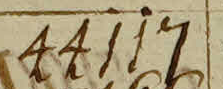44117
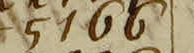5166
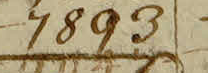7893
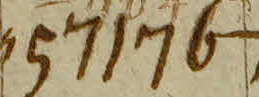57176
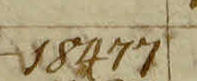18477
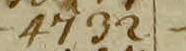4732
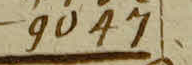9047
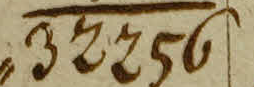32256
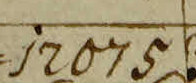12075
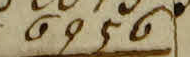6956
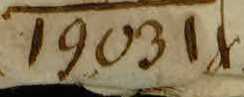19031
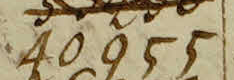40955
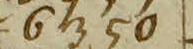6350
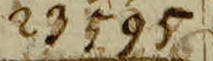23595
